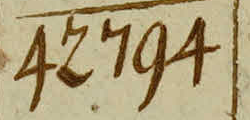42794
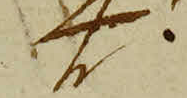4
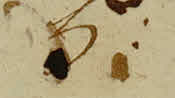5:
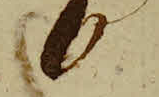6
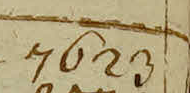7623
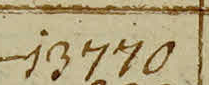13770
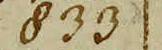833
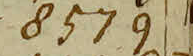8579
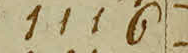1116
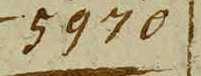5970
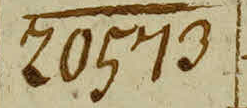20573
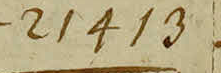21413
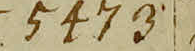5473
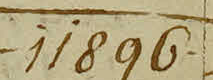11896
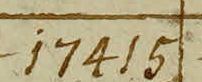17415
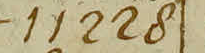11228
